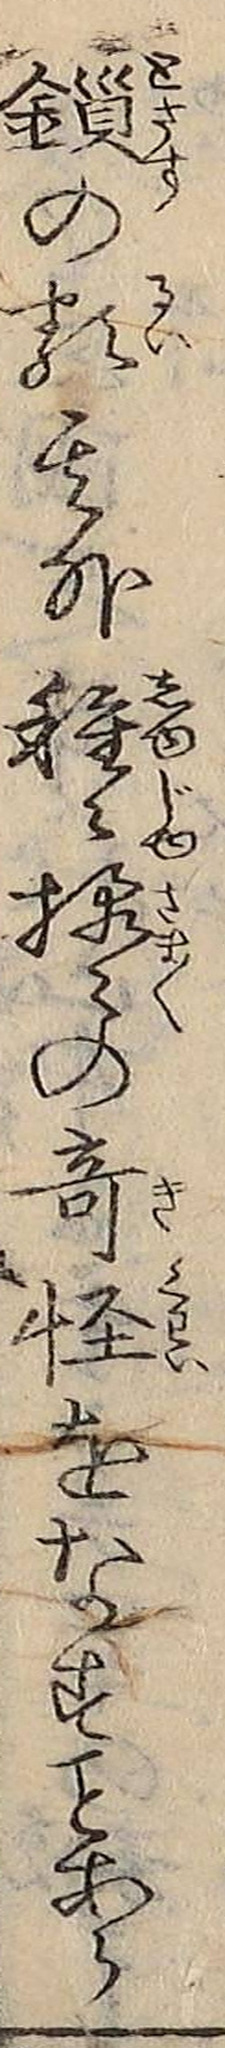鎖の類其外種々様々の奇怪をなすことあら
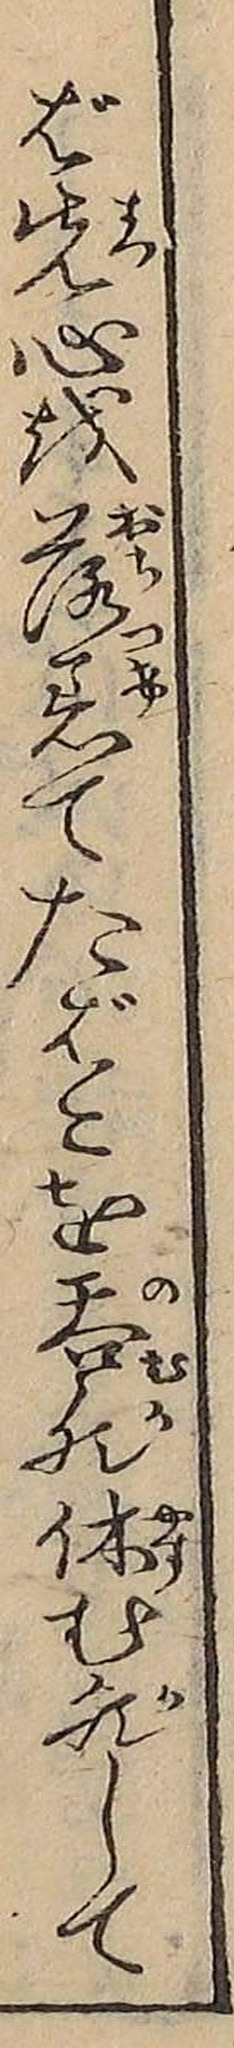ば先心を落着てたばこを呑歟休む歟して
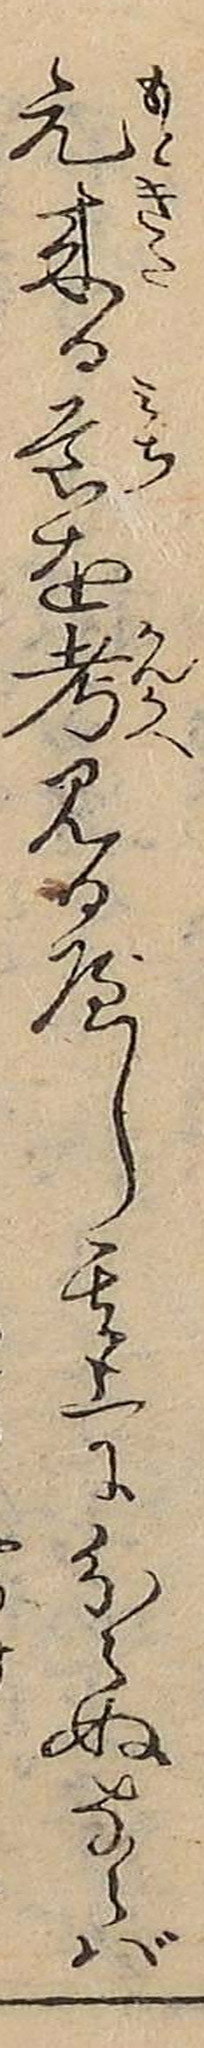元来る道を考見るべし其上に分らぬならば
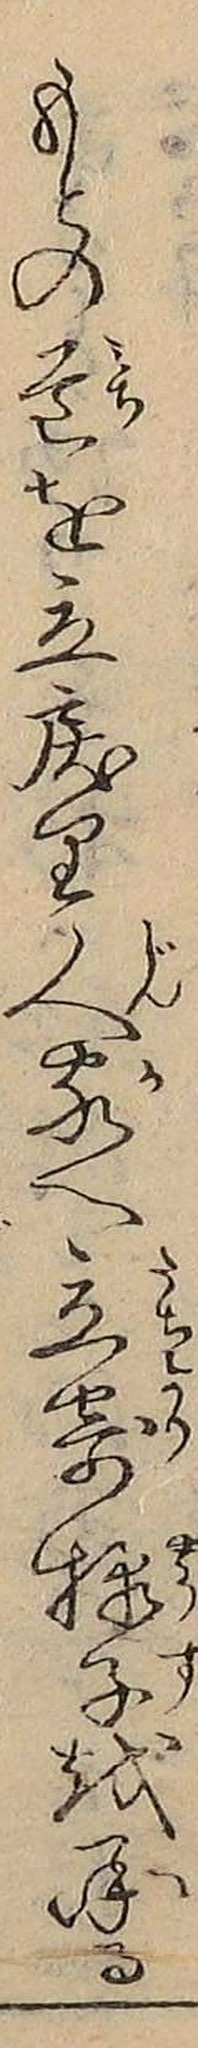もとの道を立戻り人家へ立寄様子を承る
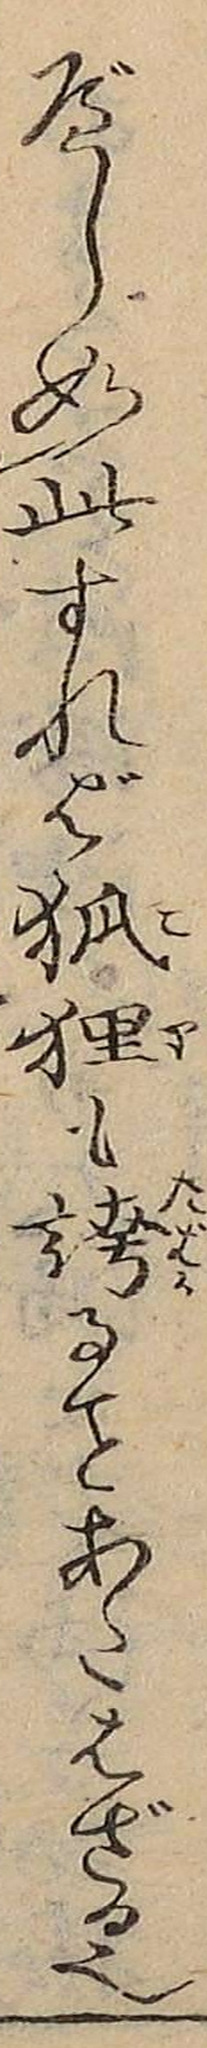べし如此すれば狐狸も譇ることあたはざる也
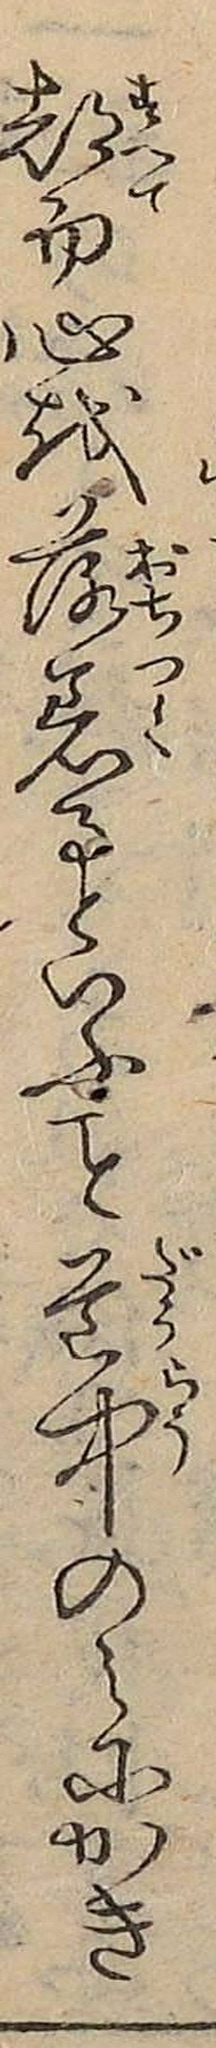都而心を落着るといふこと道中のみにかき
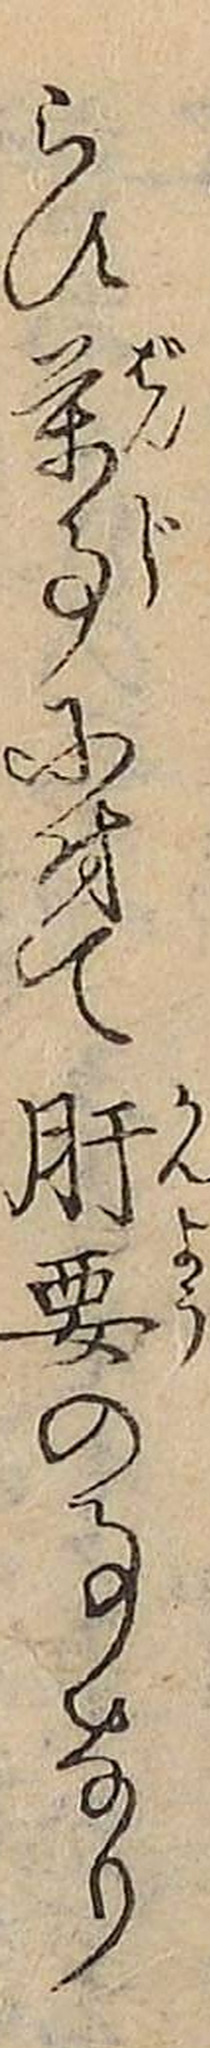らす万事に付て肝要の事なり
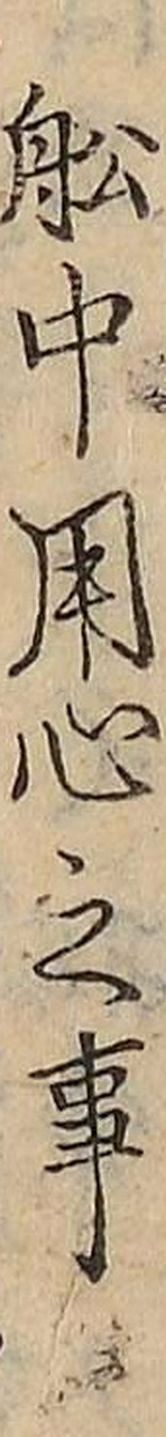船中用心之事
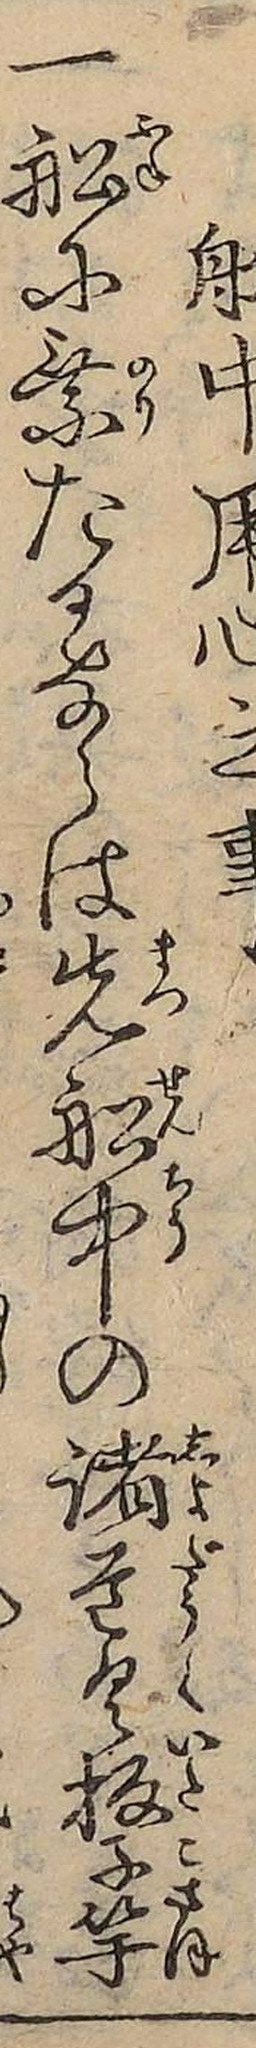一船に乗たるならは先船中の諸道具板子竿
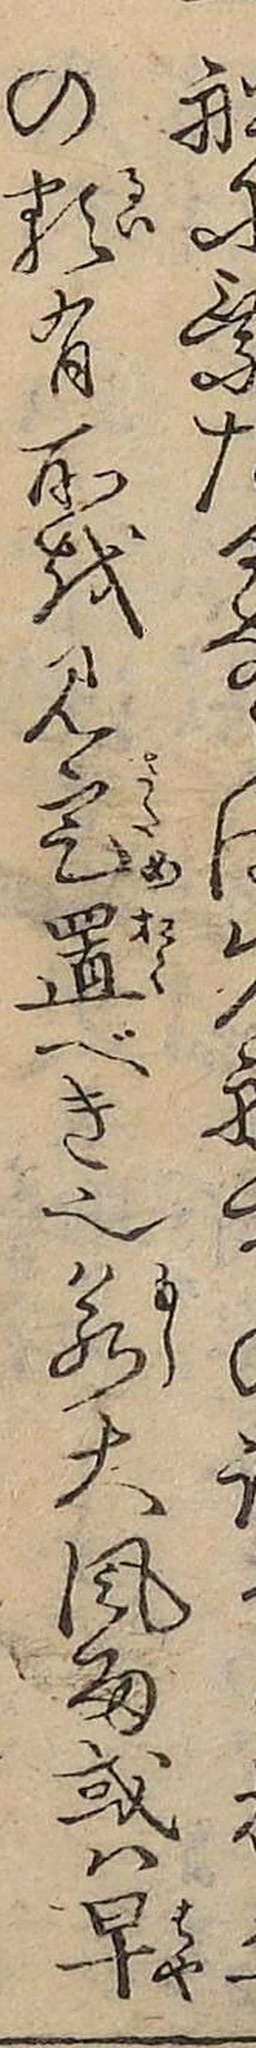の類有所を見定置べき也若大風雨或は早
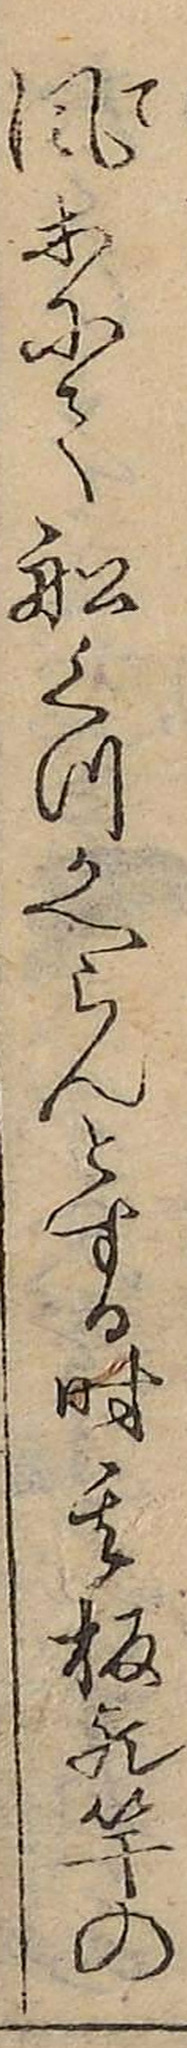風等にて船くつかへらんとする時其板歟竿の

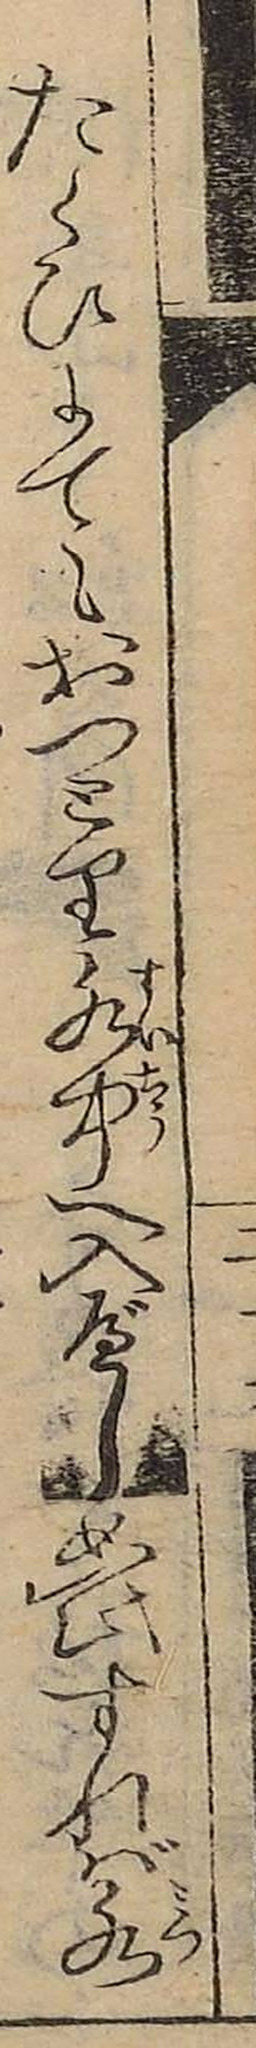たくひにてもおつとり水中へ入べし如此すれば水
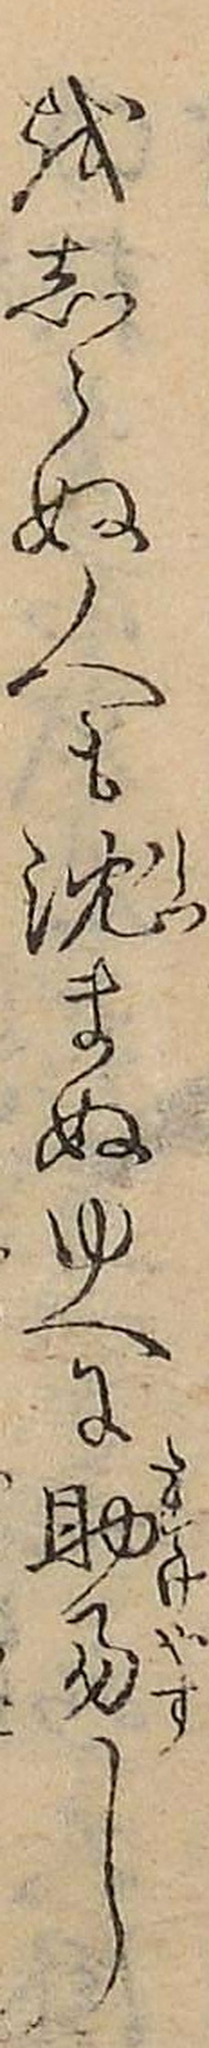をしらぬ人も沈まぬゆへに助易し
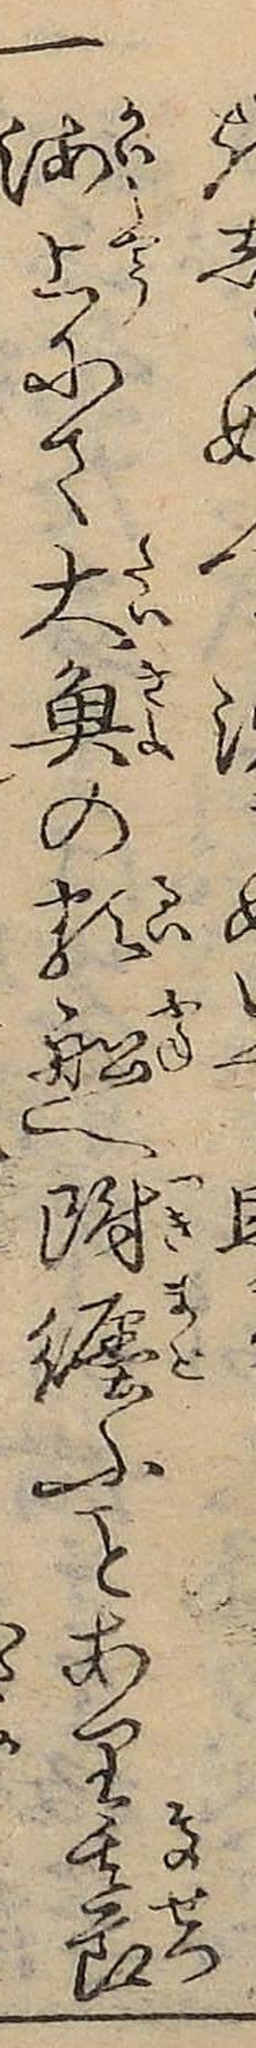一海上にて大魚の類船へ附纏ふことあり其節
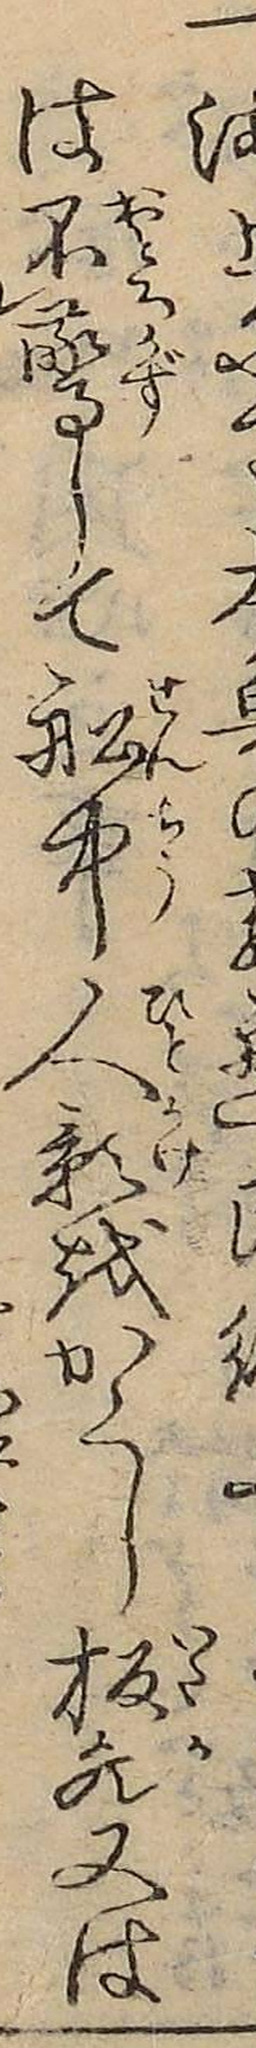は不驚して船中人影をかくし板歟又は
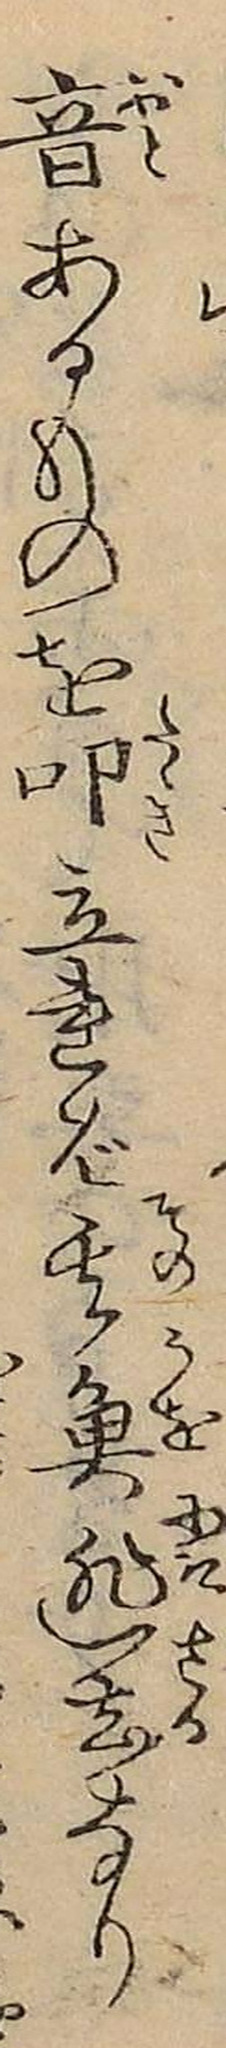音あるものを叩立れば其魚逃去なり
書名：旅行用心集
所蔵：神戸大学附属図書館 国文学研究資料館
